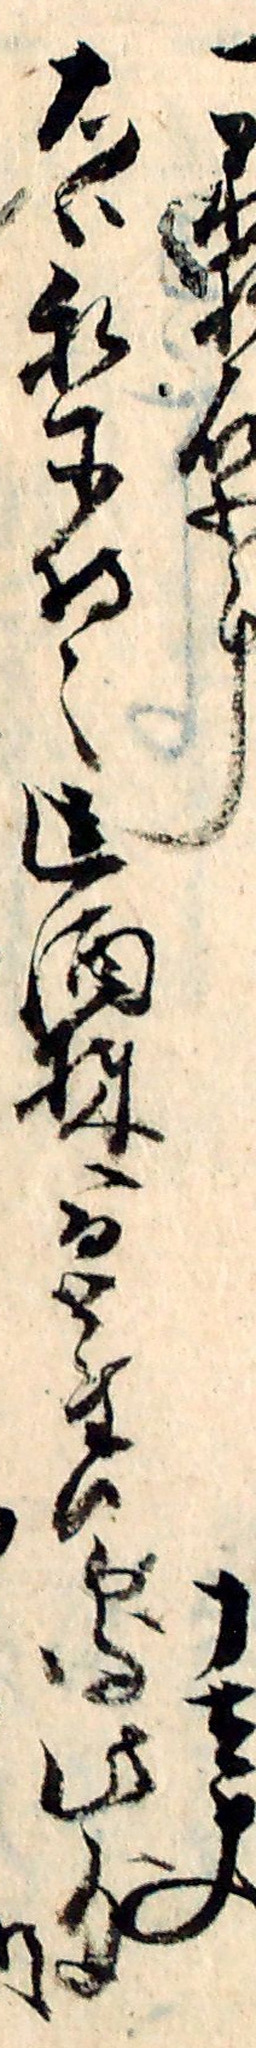右は私所持之造酒株にて御座候処此度
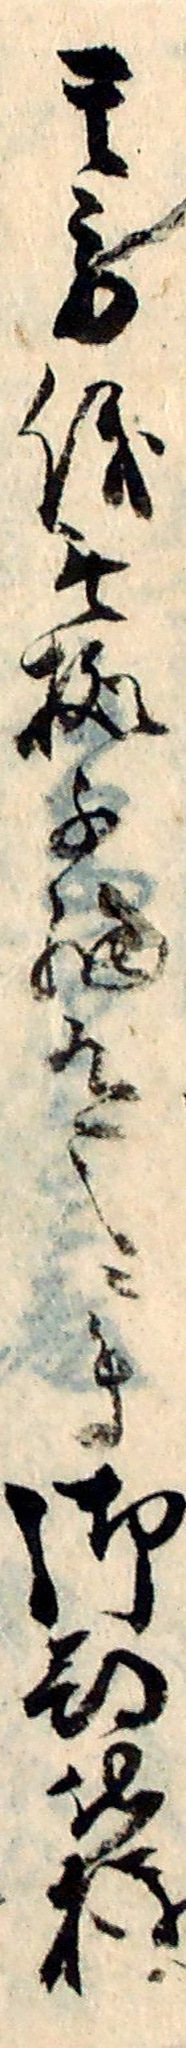其方儀無拠子細有之に付御郡代様へ
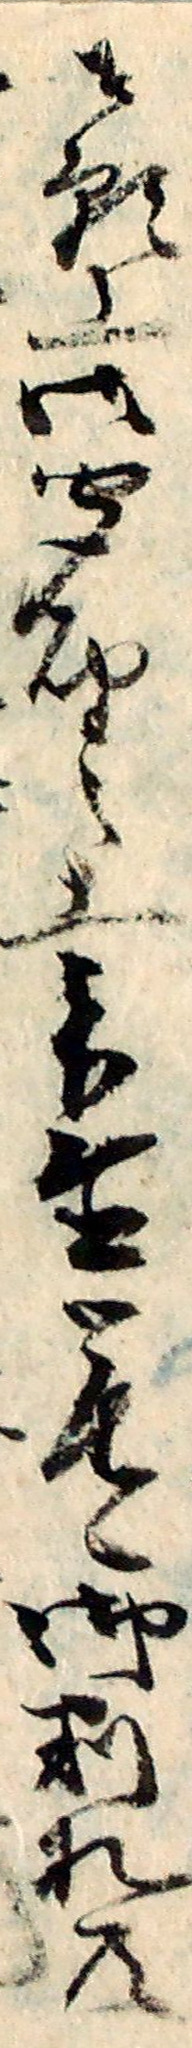奉願上御聞届之上被下置御座候御判札共
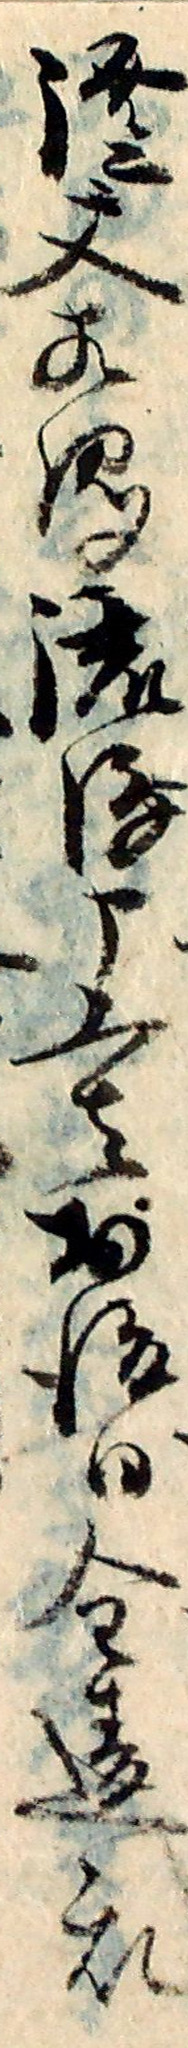証文相認め譲渡申上は於後日全違乱
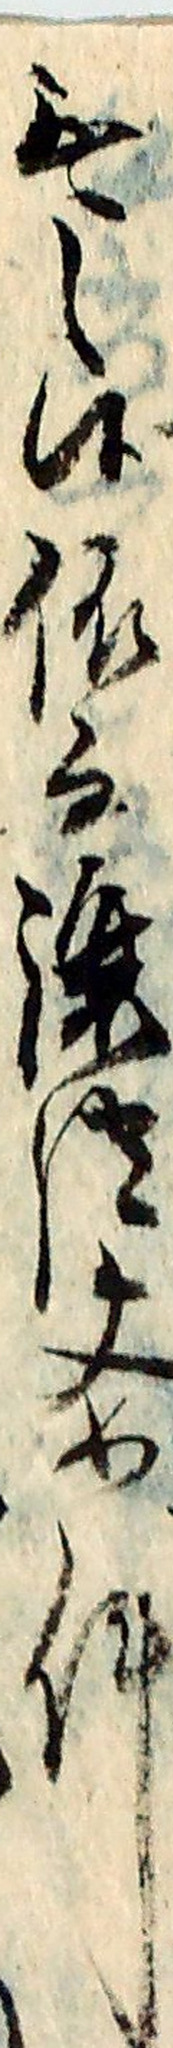無之候依て譲証文如件
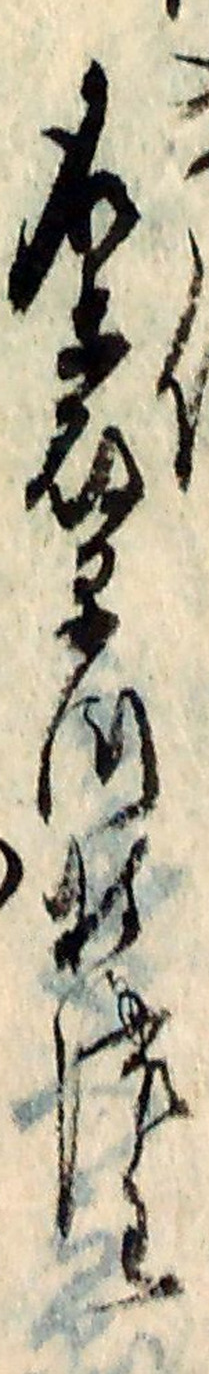名東郡早淵村譲主
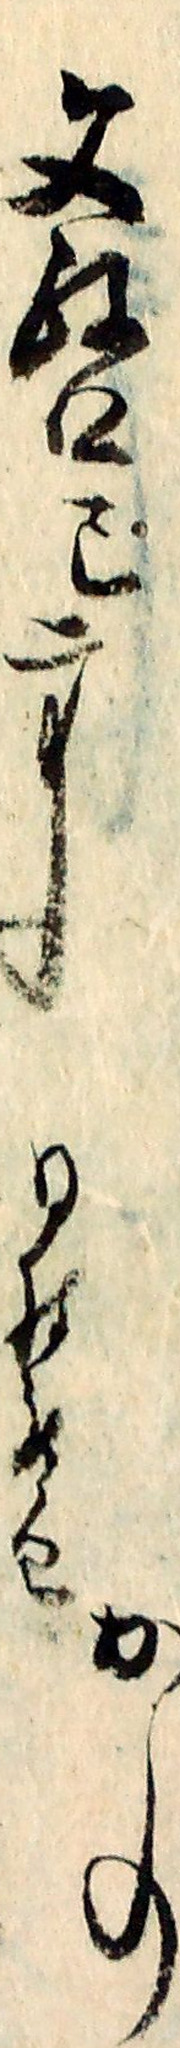文政四巳二月同村庄屋
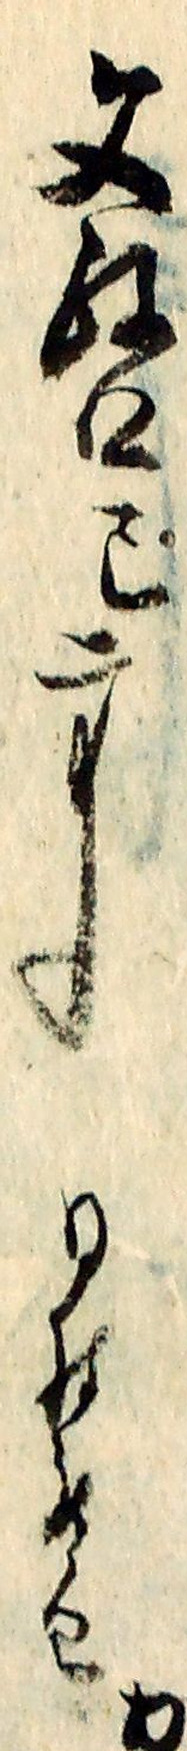文政四巳二月同村庄屋
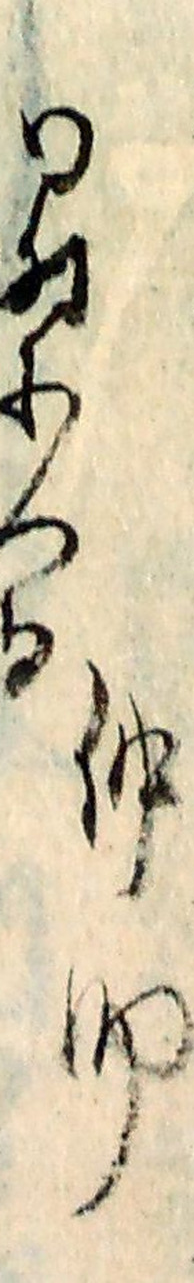同村五人与
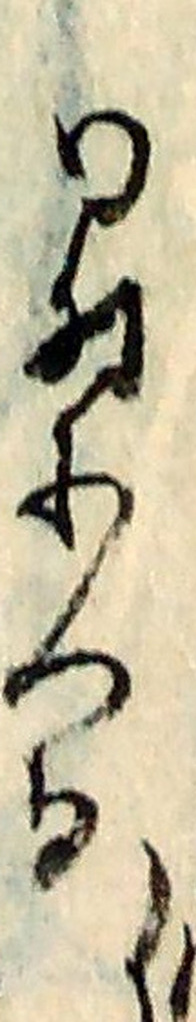同村五人与
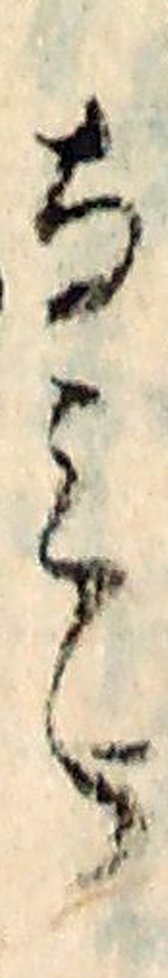与三郎
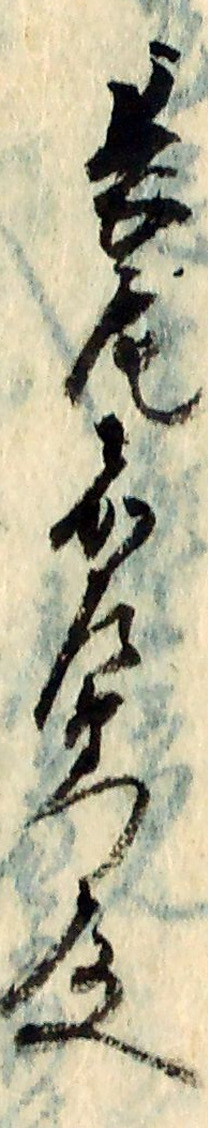長尾嘉左衛門殿
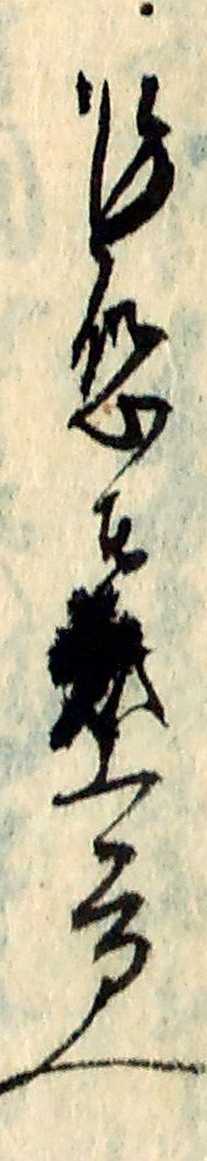乍恐奉願上覚
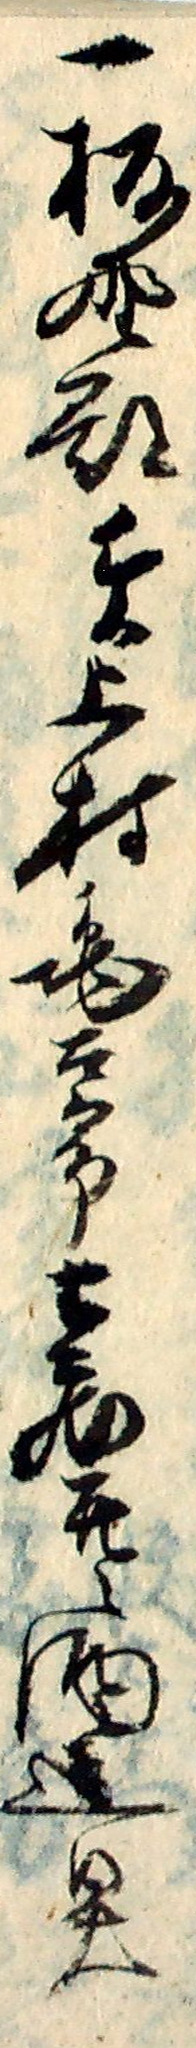一板野郡矢上村亀太郎土蔵并に酒造具
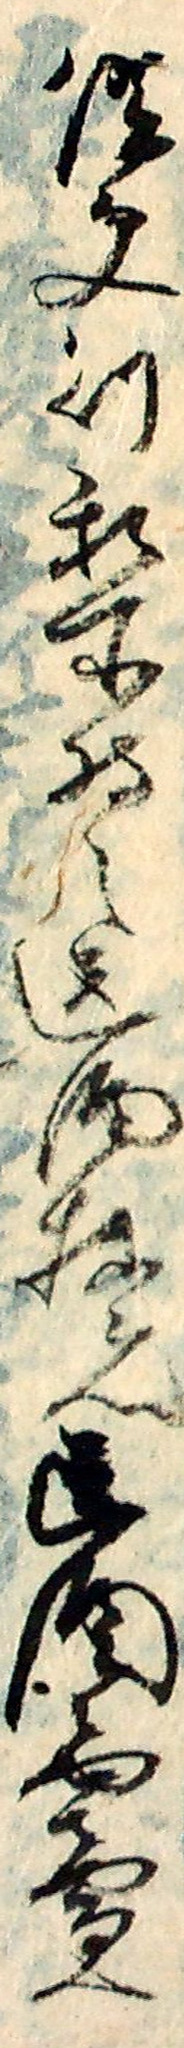譲受則私所持之造酒株を以造酒商売
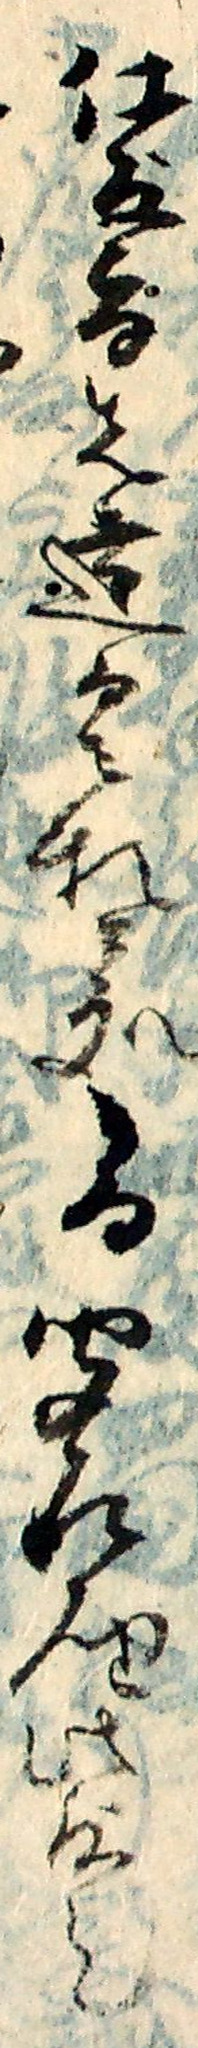仕度旨先達て奉願上候処被為聞召届此度迄
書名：諸御願書控(後藤氏壱番）
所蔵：鳴門教育大学 Naruto University of Education
